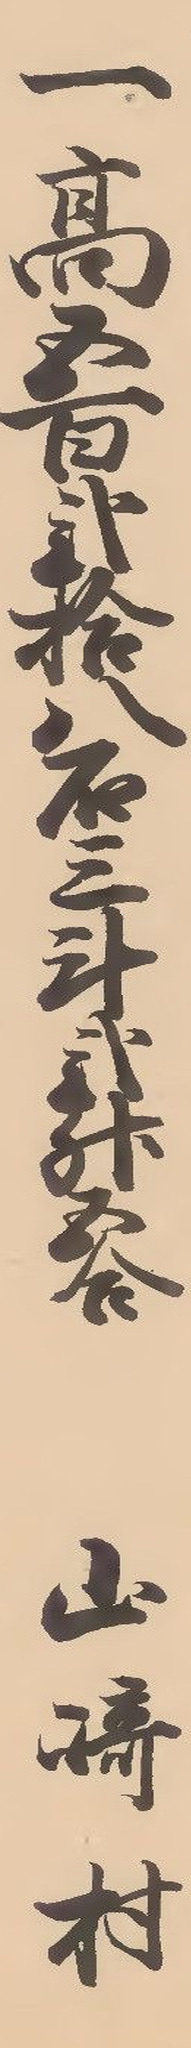一高五百弐拾八石三斗弐升五合山崎村
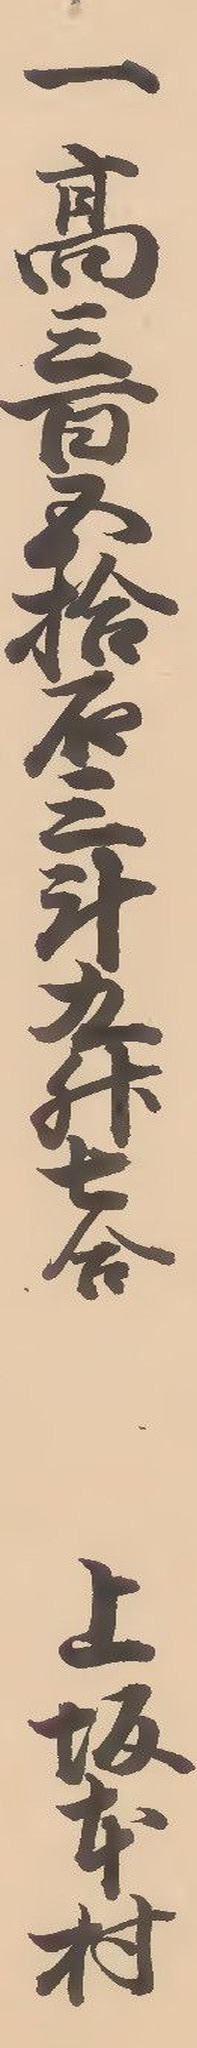一高三百五拾石三斗九升七合上坂本村
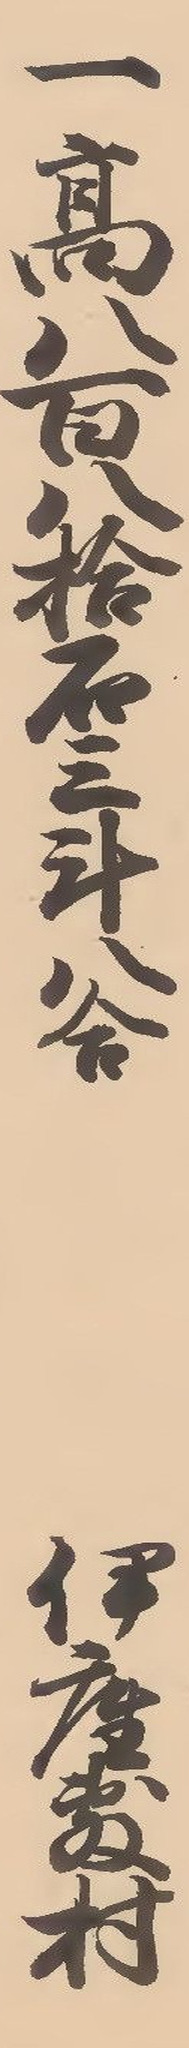一高八百八拾石三斗八合伊座敷村
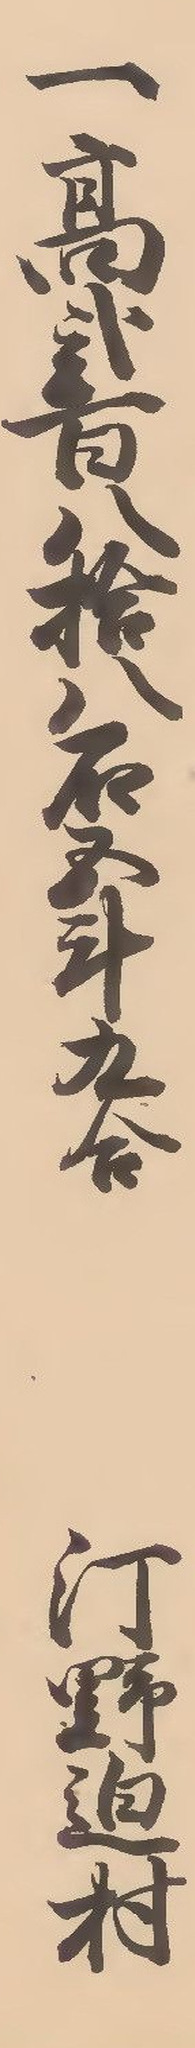一高弐百八拾八石五斗九合汀野迫村

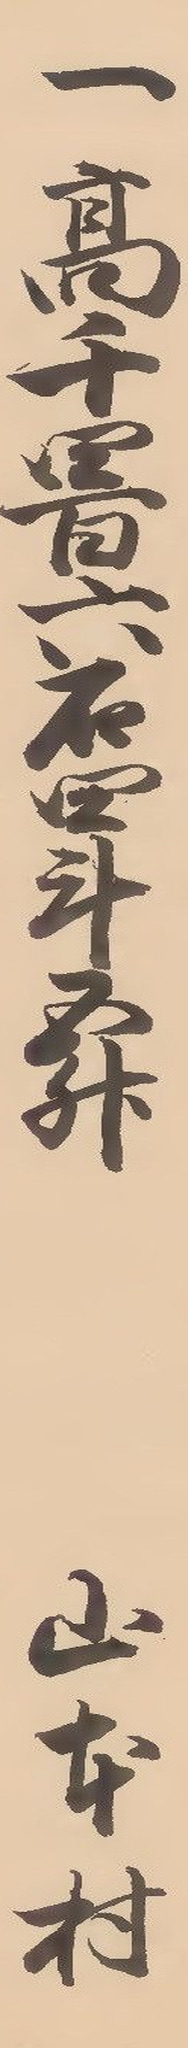一高千四百六石四斗五升山本村
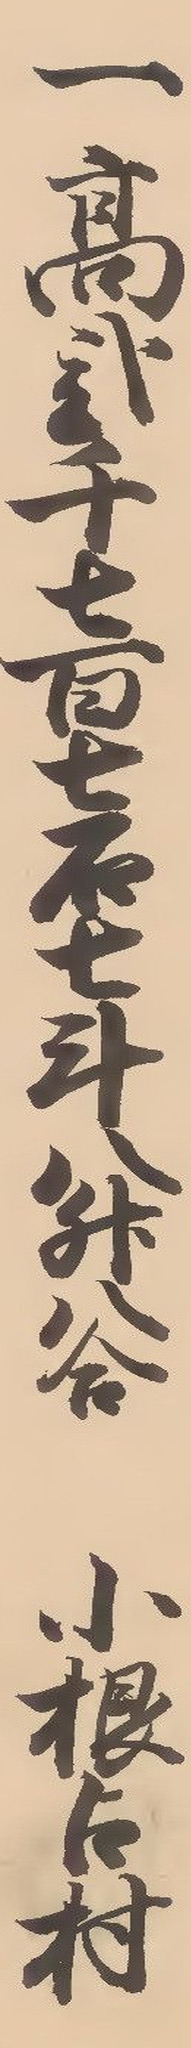一高弐千七百七石七斗八升八合小根占村
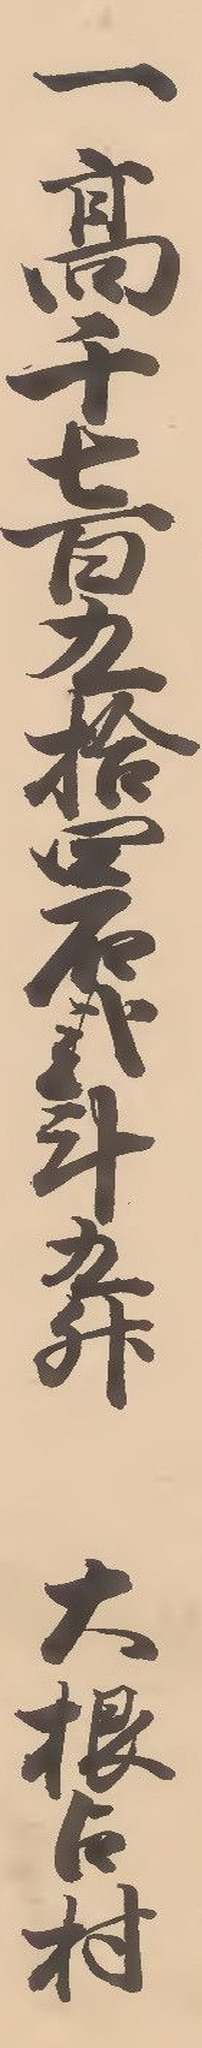一高千七百九拾四石弐斗九升大根占村
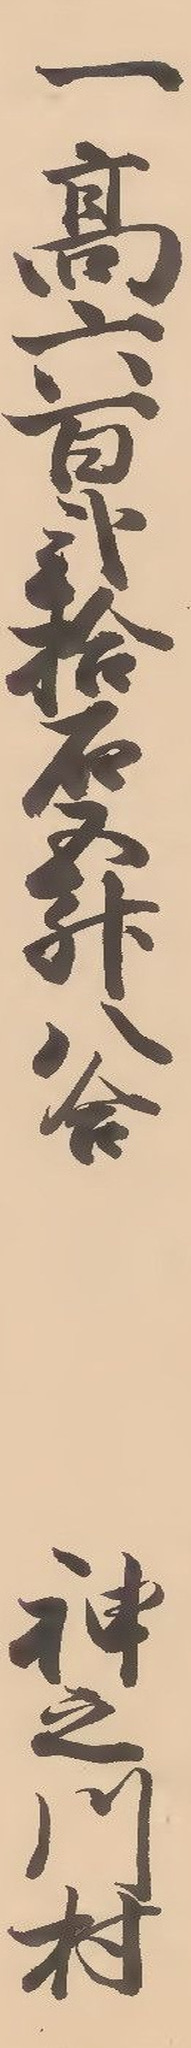一高六百弐拾石五升八合神之川村
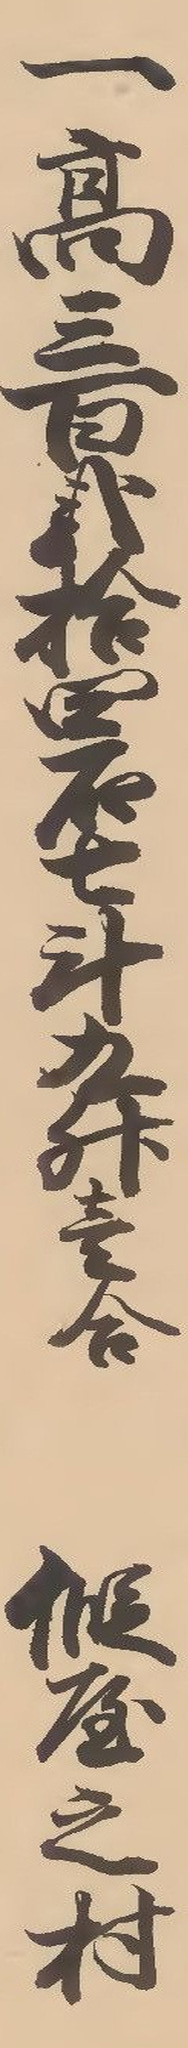一高三百弐拾四石七斗九升壱合仮屋之村
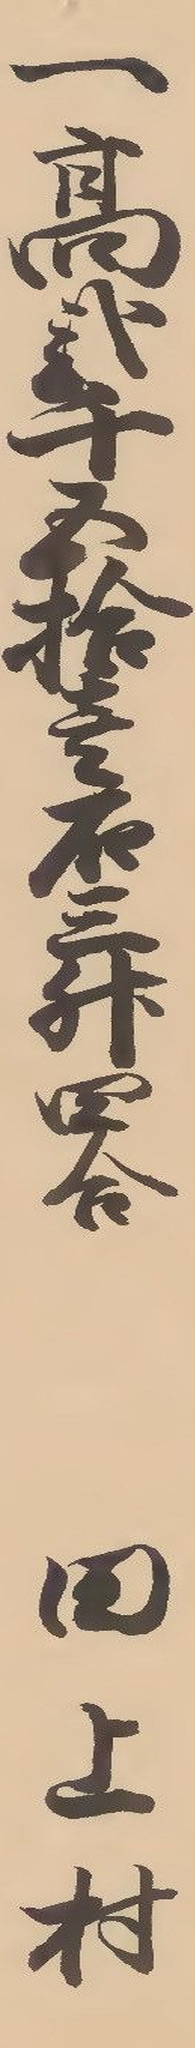一高弐千五拾壱石三升四合田上村
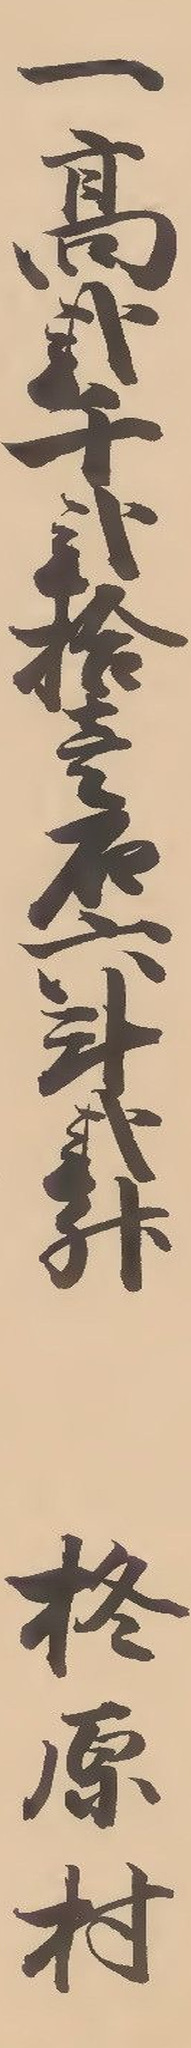一高弐千弐拾壱石六斗弐升柊原村
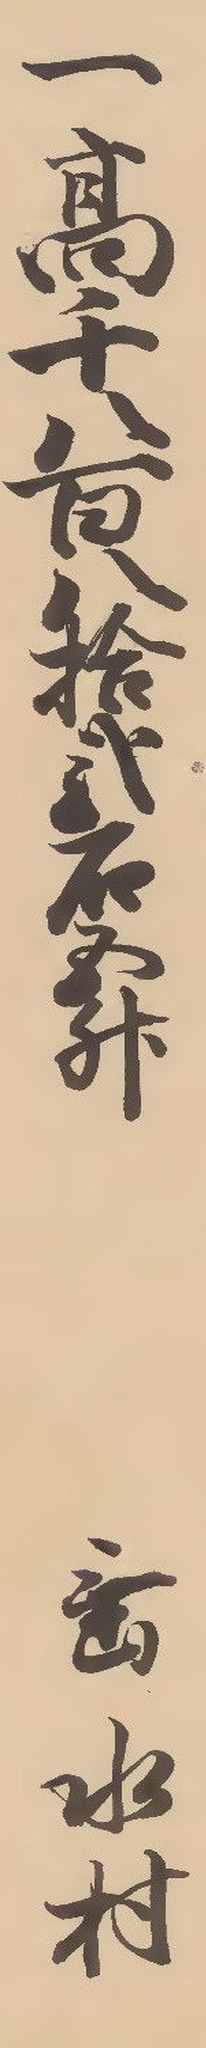一高千八百八拾弐石五升垂水村

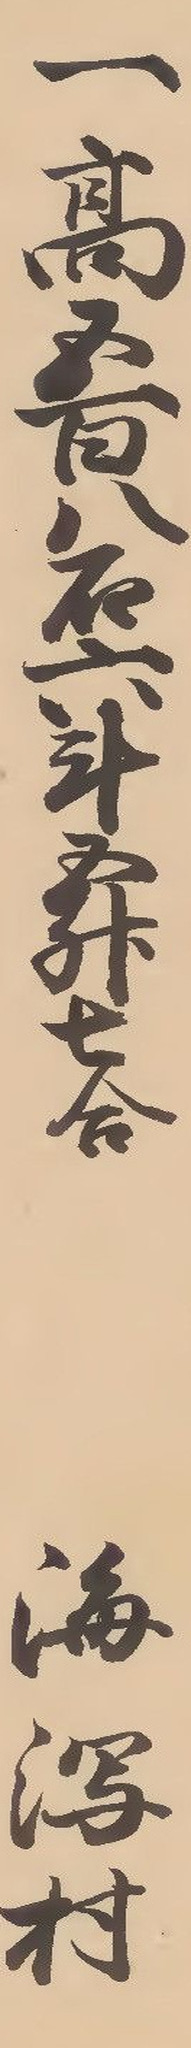一高五百八石六斗五升七合海潟村
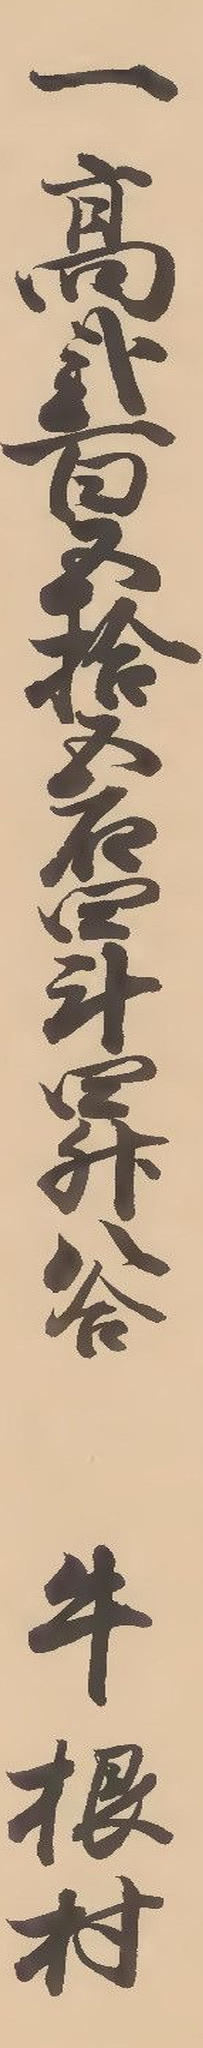一高弐百五拾五石四斗四升八合牛根村
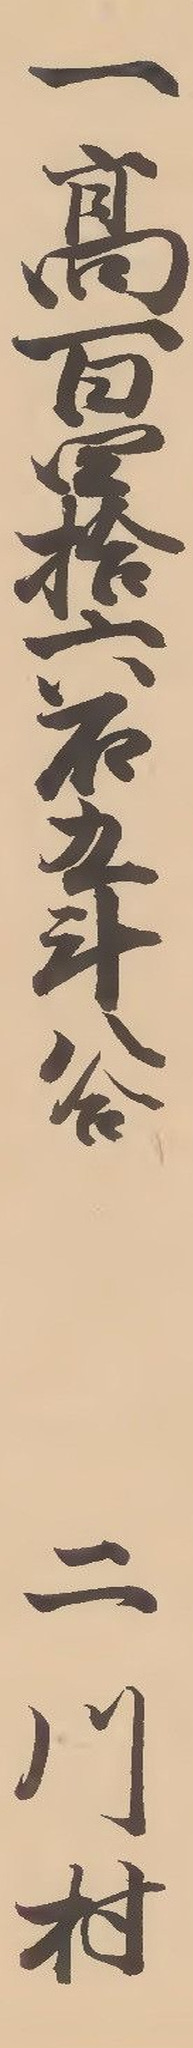一高百四拾六石九斗八合二川村
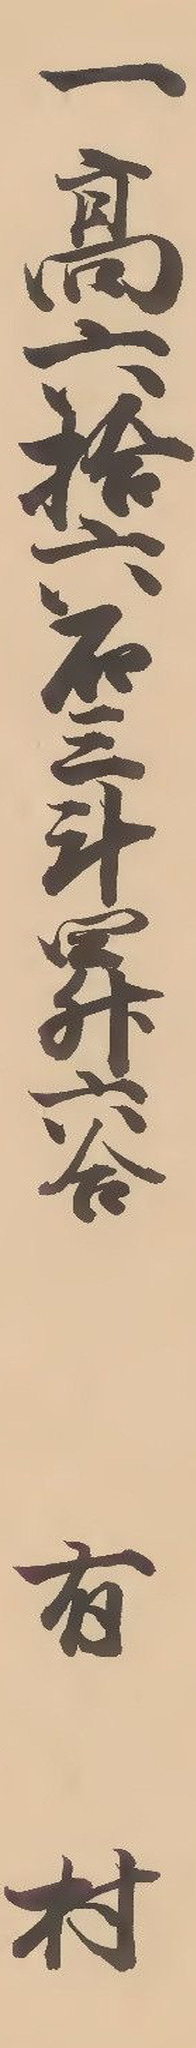一高六拾六石三斗四升六合有村
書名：大隅国郷帳
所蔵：国立公文書館 National Archives of Japan
